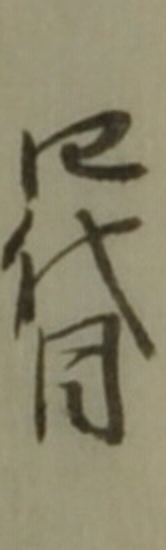四代目
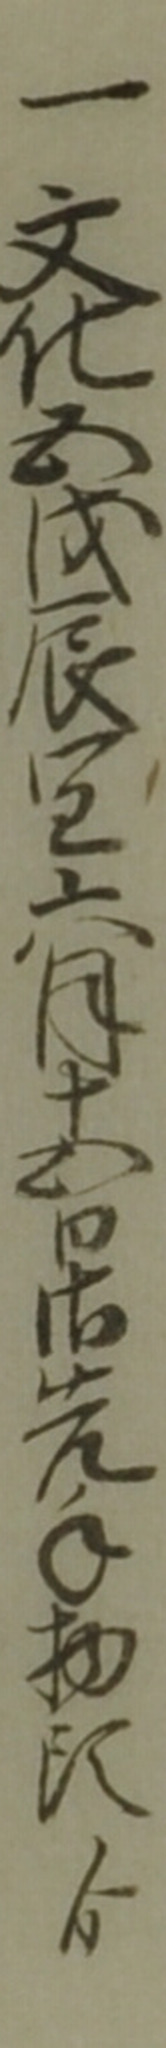一文化五戊辰閏六月十五日御先手物頭ゟ
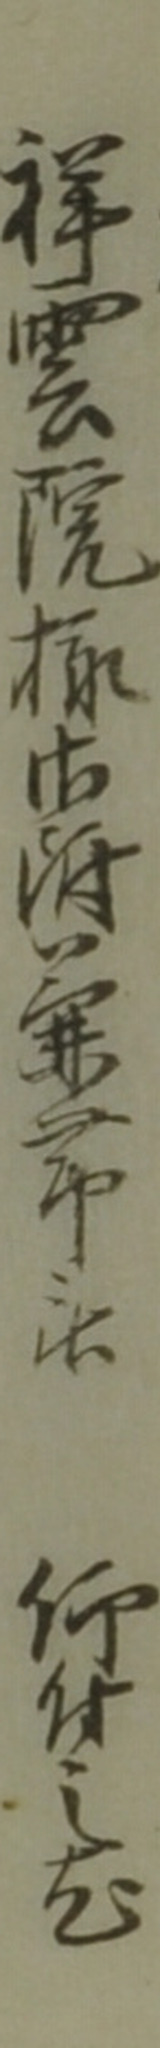祥雲院様御附兼帯被仰付之尤
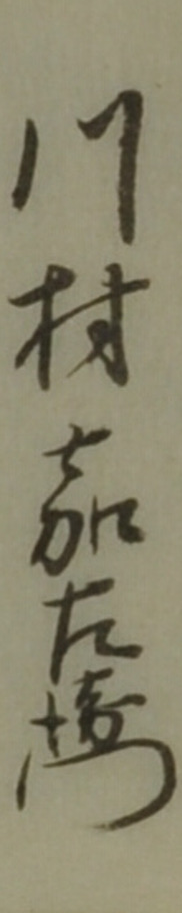川村嘉左衛門
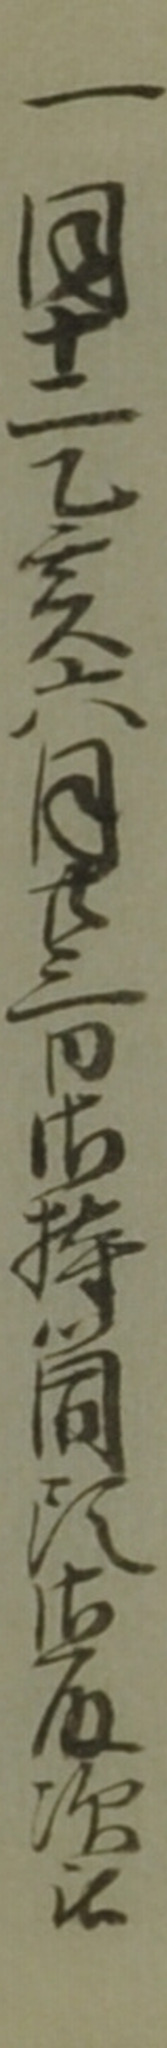一同十二乙亥六月廿三日御持筒頭御取次被
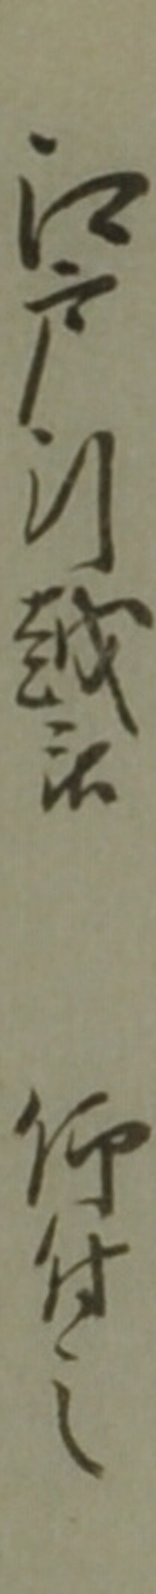江戸引越被仰付之
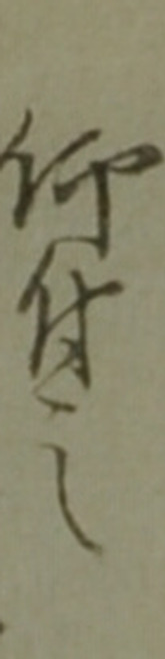仰付之
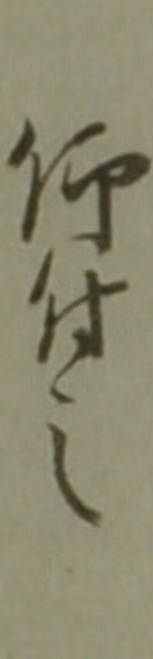仰付之
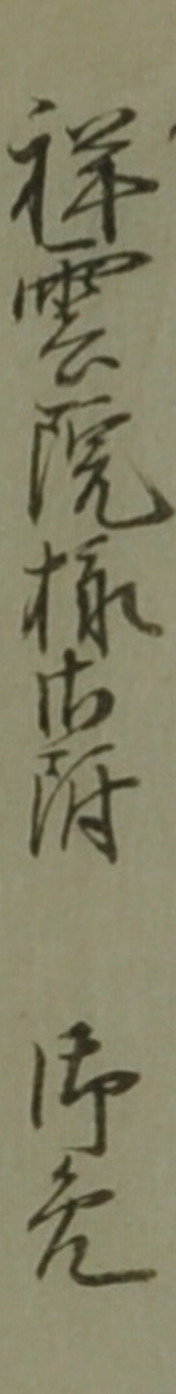祥雲院様御附御免
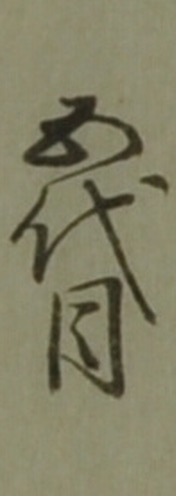五代目
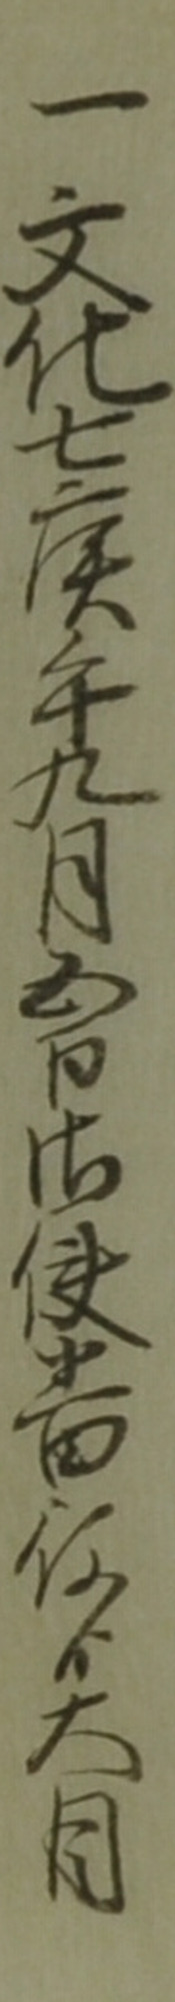一文化七庚午九月五日御使番役ゟ大目
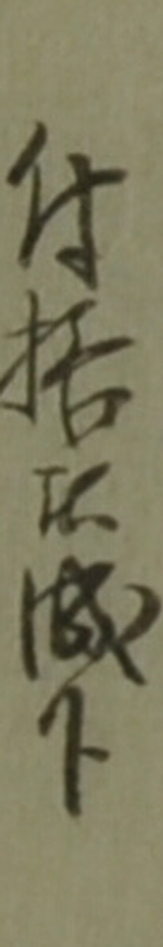付格被成下
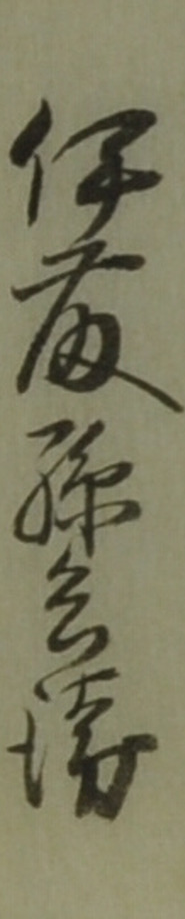伊藤孫兵衛
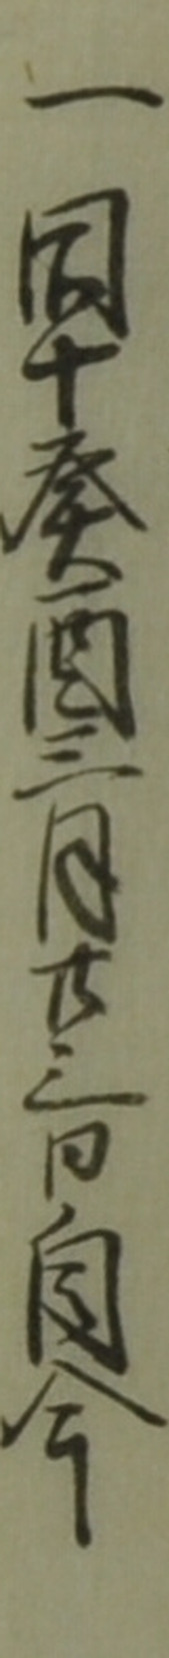一同十癸酉三月廿三日自今
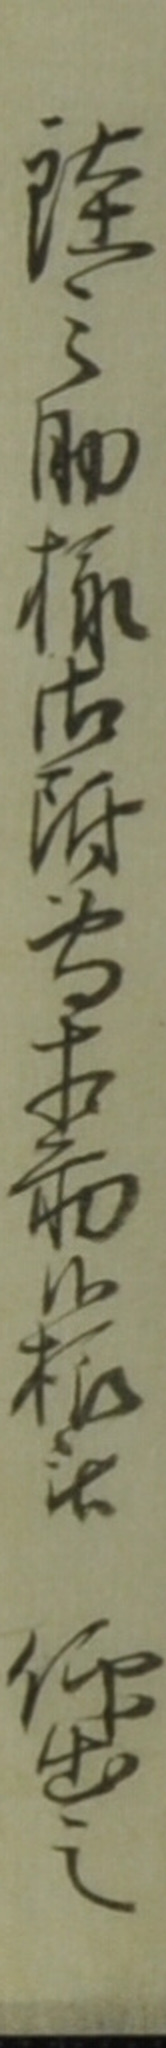銈之助様御附専相勤候様被仰出之
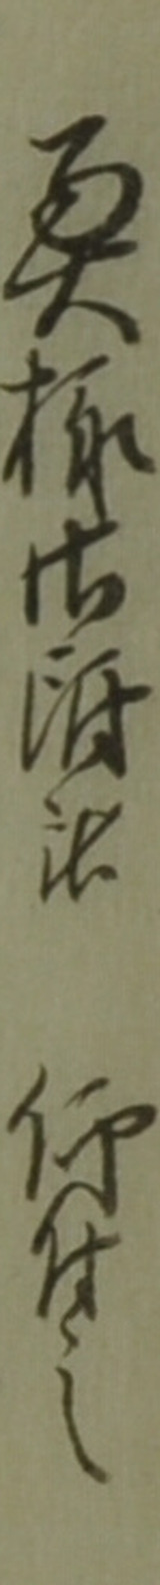奥様御附被仰付之
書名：諸御役代々録（六）
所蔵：伊那市立高遠町図書館・合同会社AMANE
